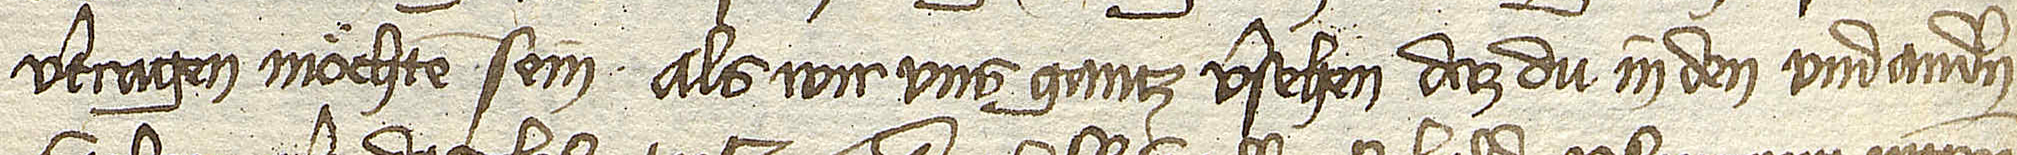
v*tragen möchte* ſein . als wir vns gancʒ v*ſehen daʒ du in den vnd andn*
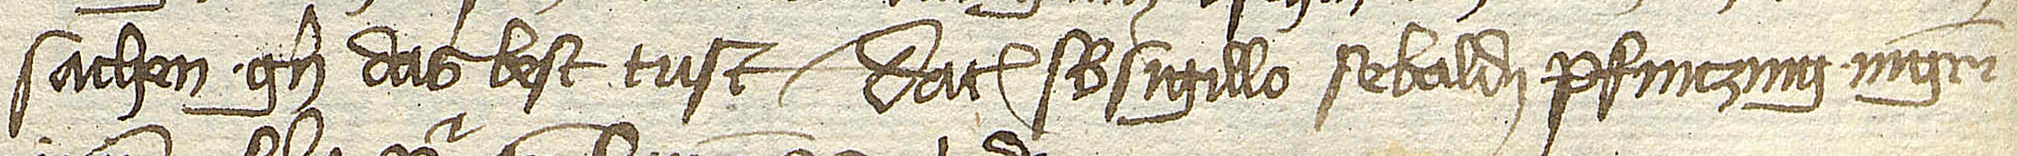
ſachen . g*n das beſt tuſt / Dat* ſ*ſigillo ſebaldi Pfincʒing . mgri*
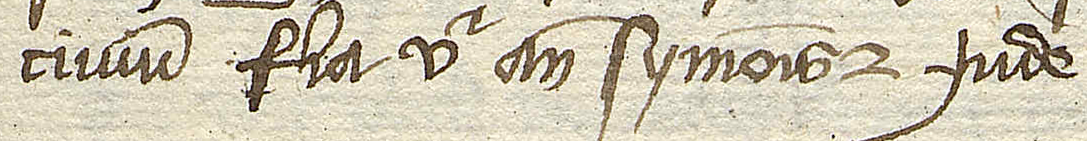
ciuiu* fi*a v* an* ſymo*is @ Iude
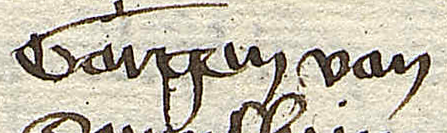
Görgen von
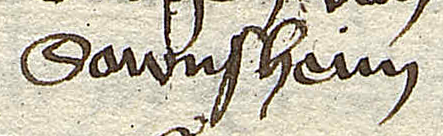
Sawnſheim
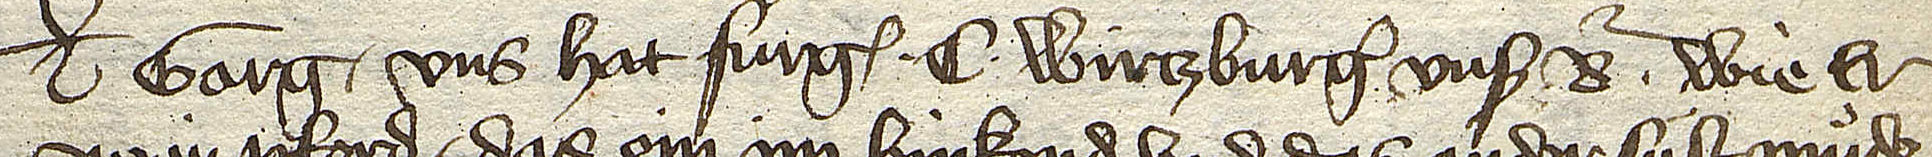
L* Gorg / vns hat fürg* . C* Wircʒburg* vnſ* B* . wie Er
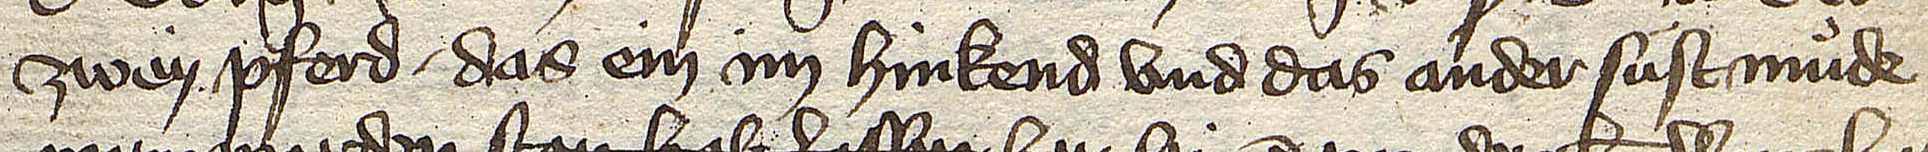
cʒwey pferd / das ein im hinkend vnd das ander ſüſt müde
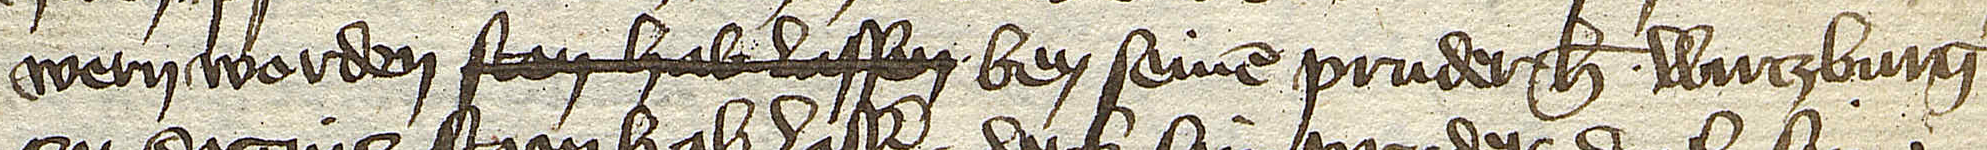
wern worden ſten hab laſſen . bey ſeine* pruder h* wircʒburg*
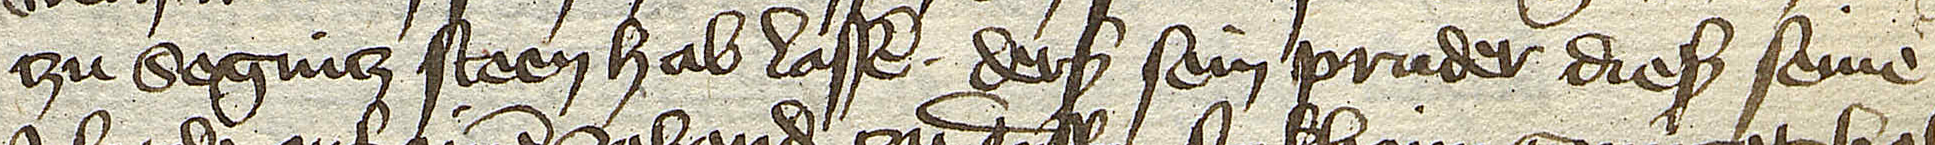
cʒu Segnicʒ ſteen hab laſſe* / derſ* ſein pruder dieſ* ſeine
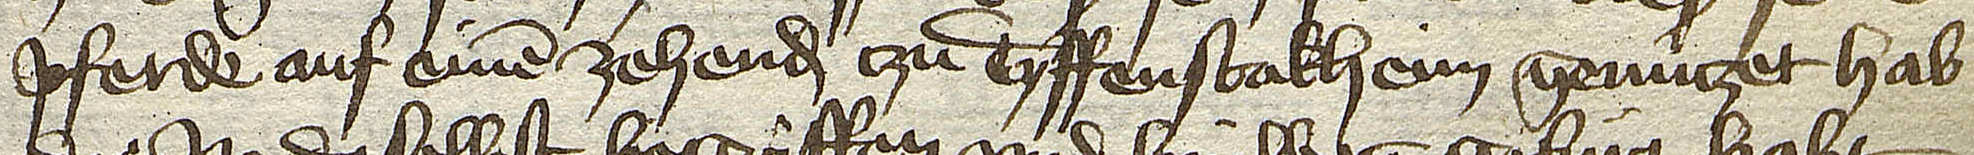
pferde auf eine* cʒehend* cʒu Tyffenſtokheim genücʒet hab
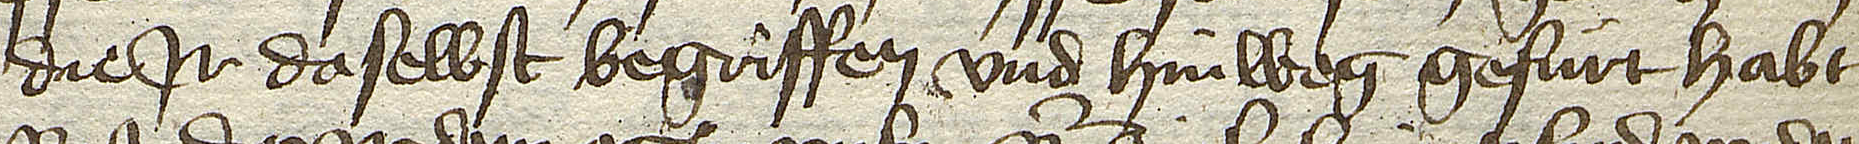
die Ir doſelbſt begriffen vnd hinweg gefürt habt
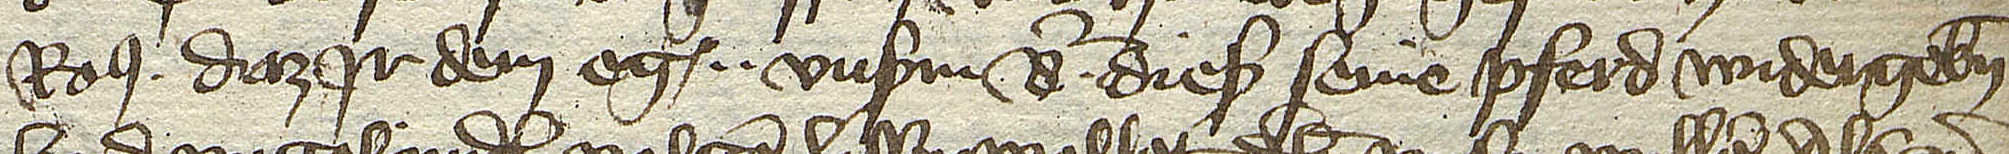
Ro* . daʒ Ir dem eg* ~ vnſ*m B* . dieſ* ſeine pferd widergebn*
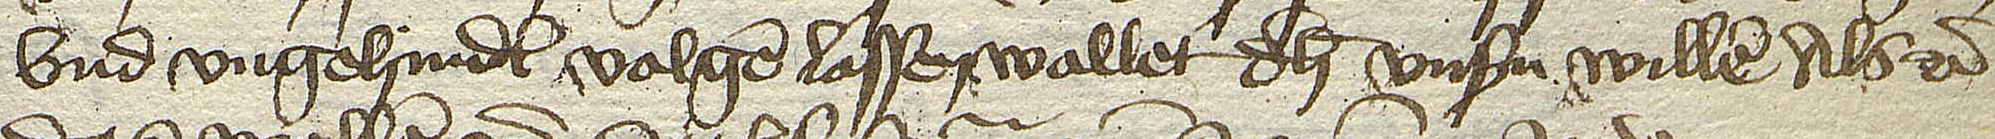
vnd vngehind*t volge* laſſen wollet dh* vnſ*n wille* Als ec*
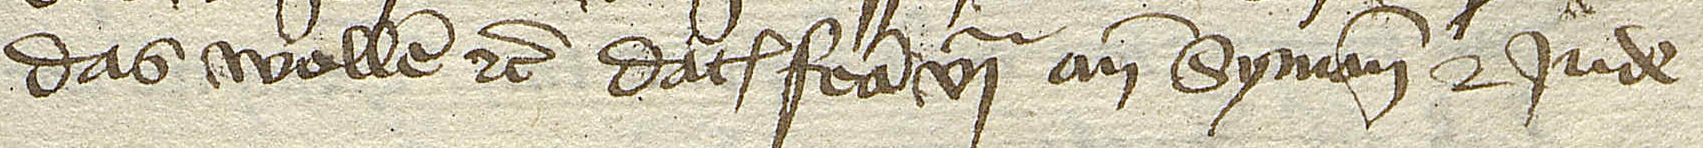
Das wolle* ec* Dat* fea* vi* an* Symon* @ Iude
